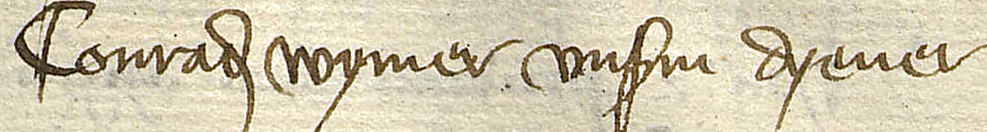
Conrad* wymer vnſ*m dyener
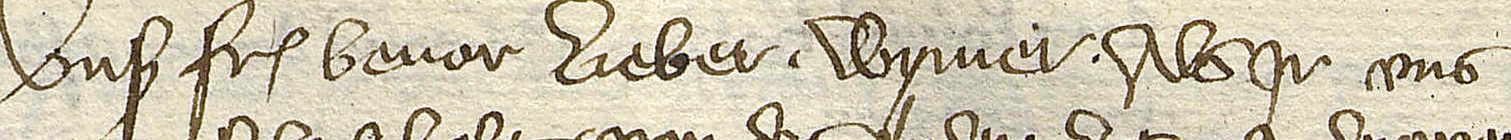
Vnſ* fr* beuor Lieber . Wymer . Als Ir vns
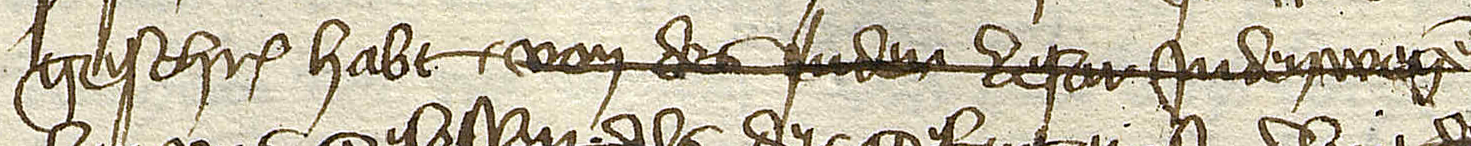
geſchr* habt / von des Iuden leſar Iuden wege*
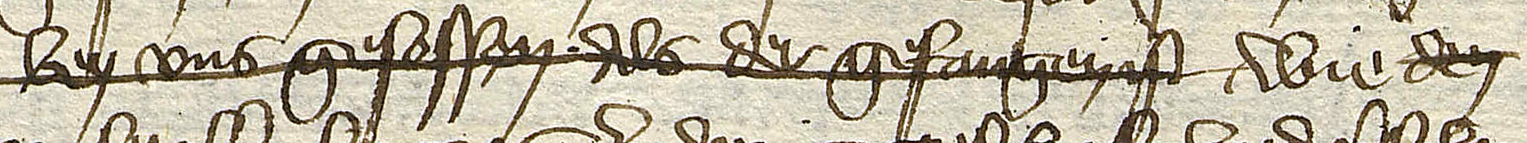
bey vns geſeſſen . Als der gefangen iſt / Wie den
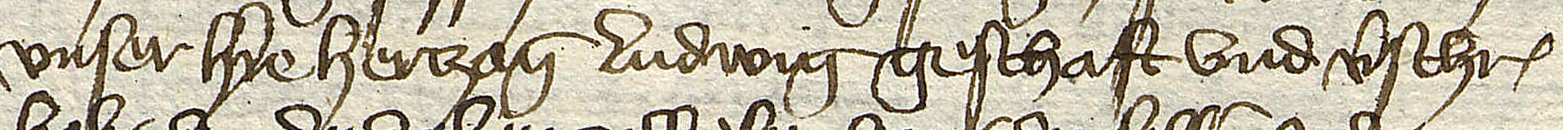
vnſer h*re hercʒog ludwig geſchaft vnd v*ſchr*
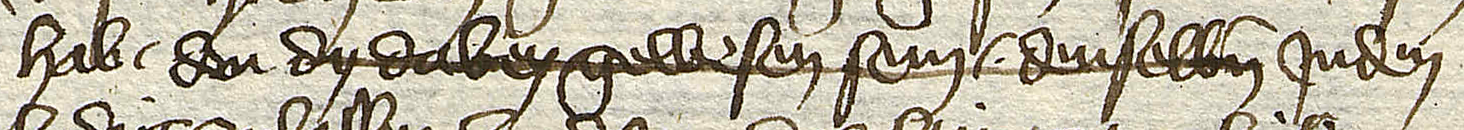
hab / den dy dabey geweſen ſein / . denſelb*n Iuden
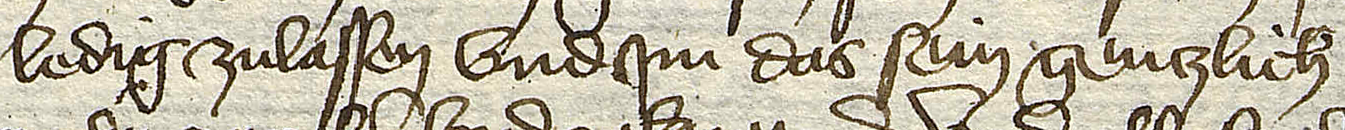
ledig cʒulaſſen vnd Im das ſein gencʒlich
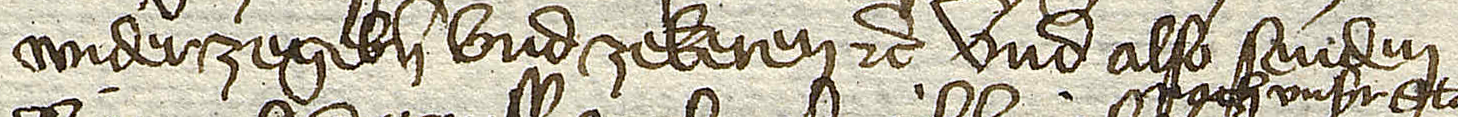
widercʒegeb*n vnd cʒekeren ec* Vnd alſo ſenden
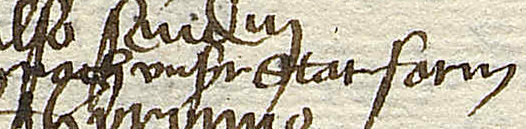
nach vnſ*r Stat form
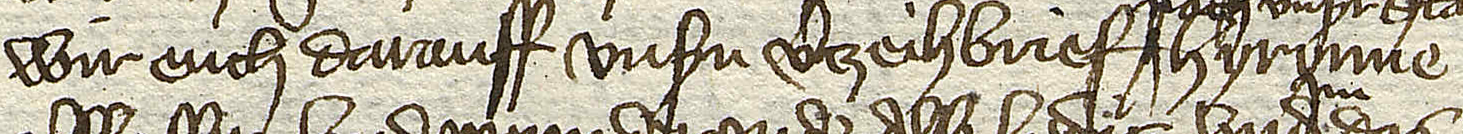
wir euch darauff vnſ*n v*cʒeihbrief hyrynne
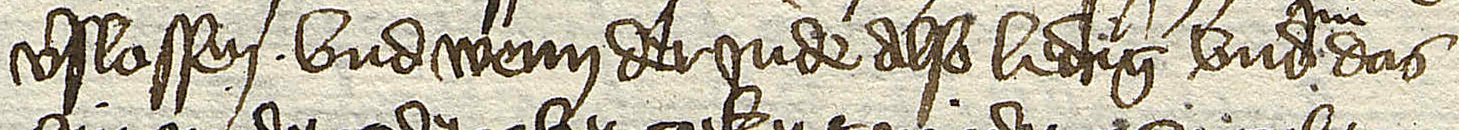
v*ſloſſen . vnd wenn der Iude Alſo ledig vnd das
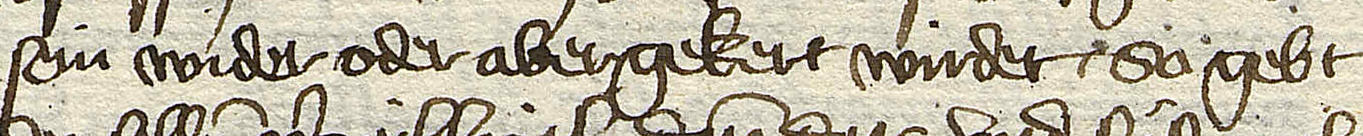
ſein wider oder aber gekert wirdet / So gebt
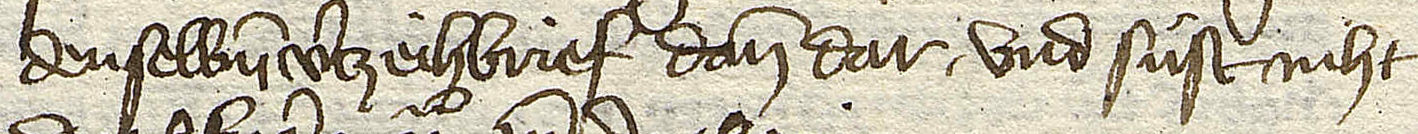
denſelb*n v*cʒeihbrief dan* dar / vnd ſüſt niht
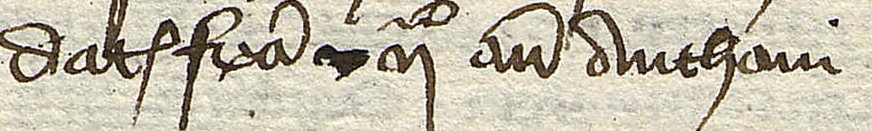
dat* fea* v ii* an* Anthoni
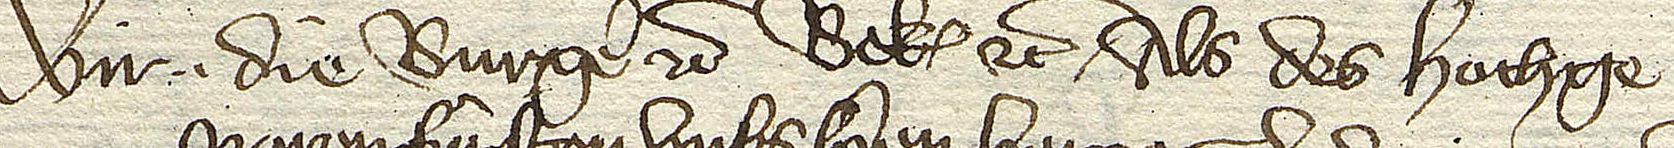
Wir ~ die Burge* ec* Bek* ec* / Als des hochge
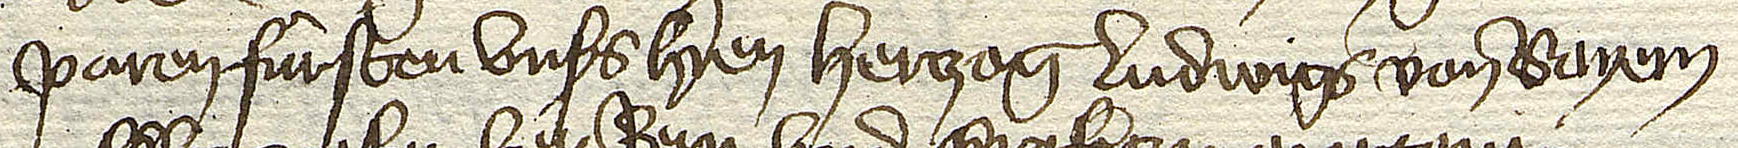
poren fürſten vnſ*s h*ren hercʒog ludwigs von Bayern
